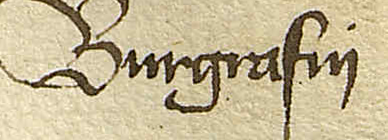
Burgrafin
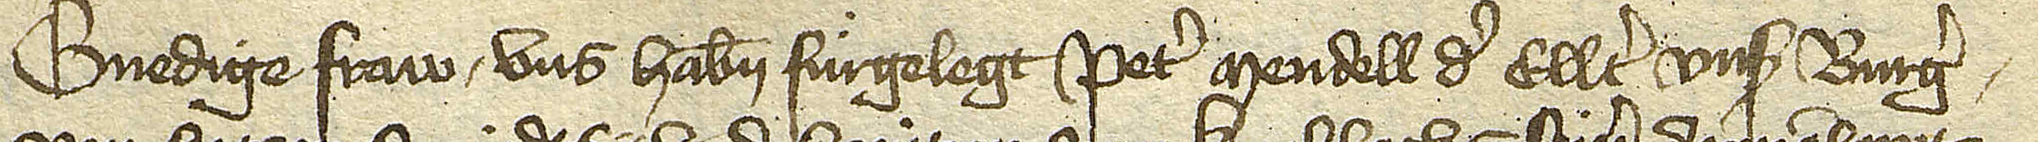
Gnedige fraw / vns habn* fürgelegt Pet* Mendell d* Ellt* vnſ* Burg* /
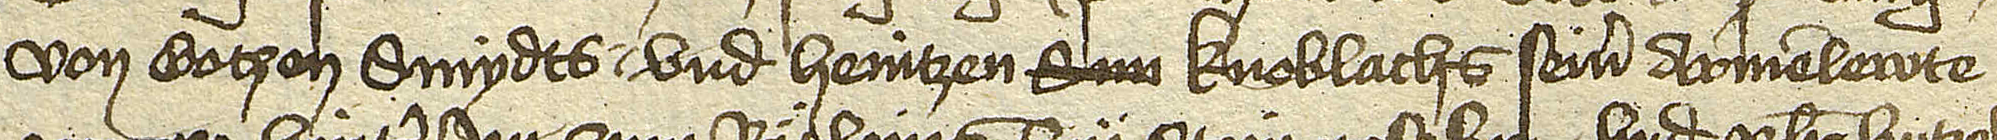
von Gotʒen Smydts / vnd heintʒen Sun Knoblachs ſein* Arme*lewte
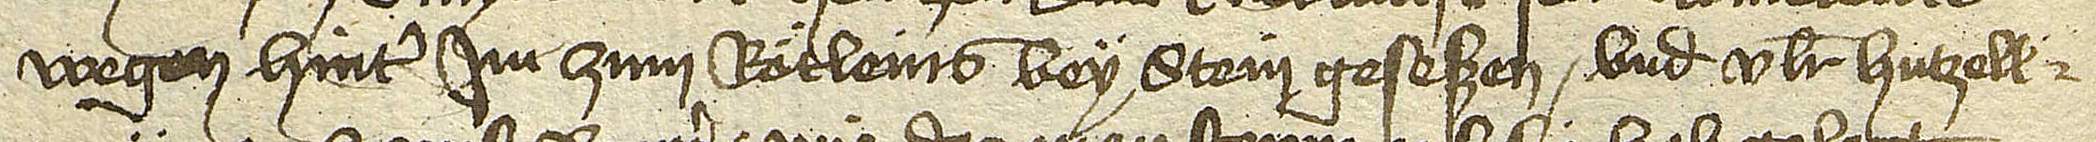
wegen hint* Im cʒum Rötleins bey Stein geſeſʒen / vnd vlr* hutʒell =
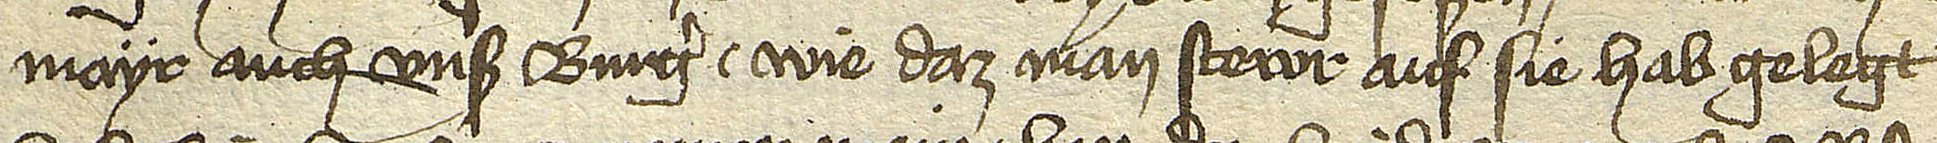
mayr auch vnſ* Burg* / wie daʒ man ſtewr auf ſie hab gelegt
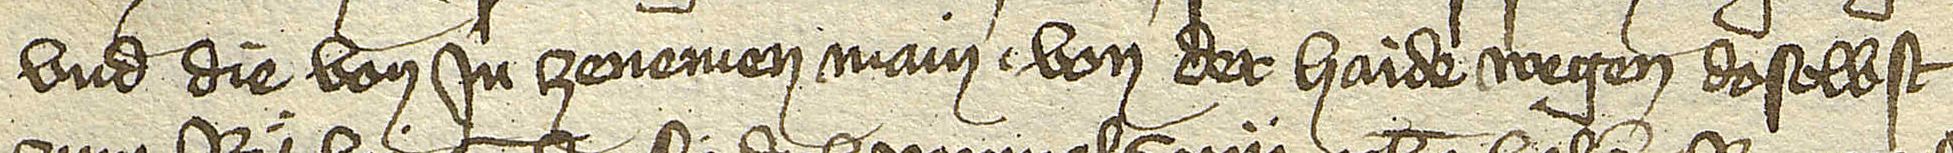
vnd die von In cʒenemen main / von der haide wegen doſelbſt
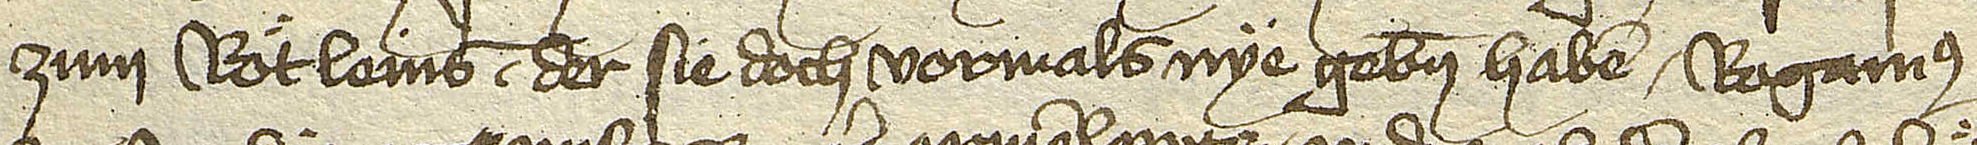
cʒum Rötleins / der ſie doch vormals mye gebn* habe* / Rogam*
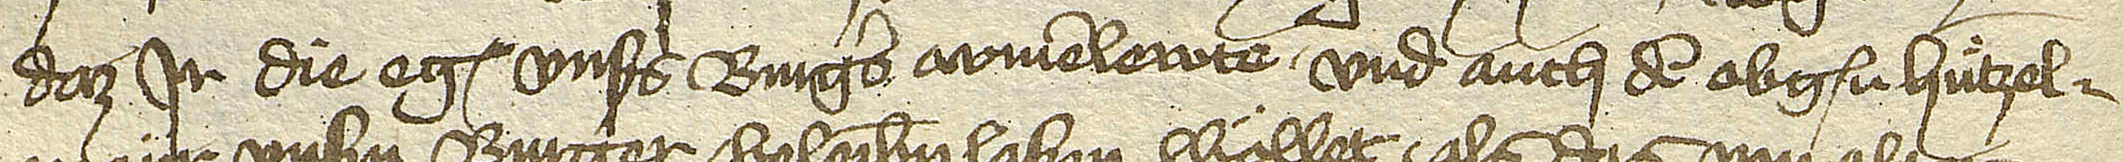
daʒ Ir die eg* vnſ*s Burgs* arme*lewte / vnd auch d* obg* ~ hütʒel =
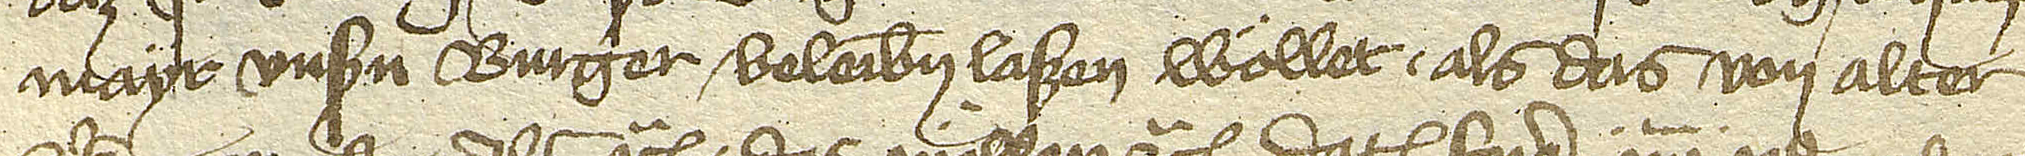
mayr vnſ*n Burger / beleibn* laſʒen wöllet / als das von alter
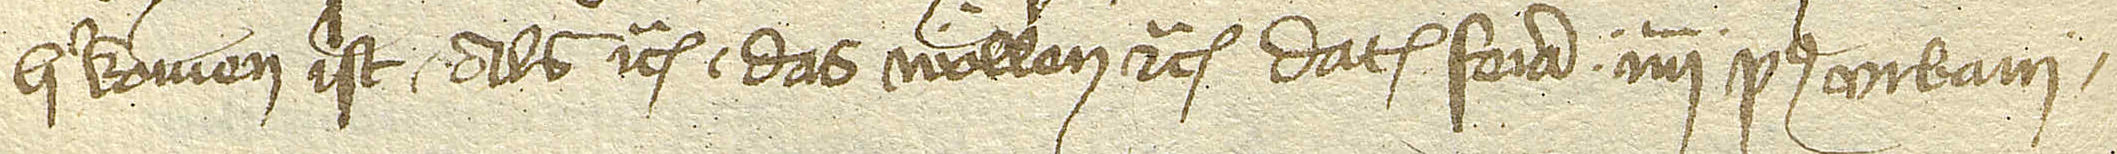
h*komen iſt / Als ec* / das wöllen ec* dat* feia* iiii* p* vrbani /
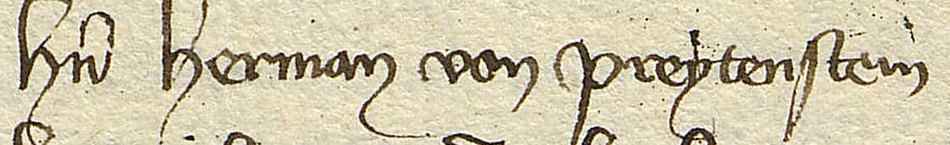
hn* herman von Preytenſtein
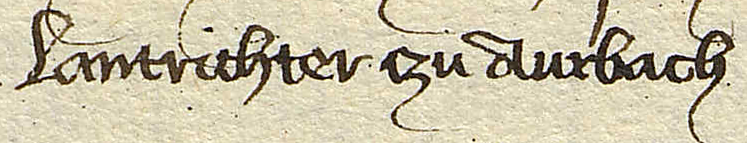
Lantrichter cʒu Aurbach
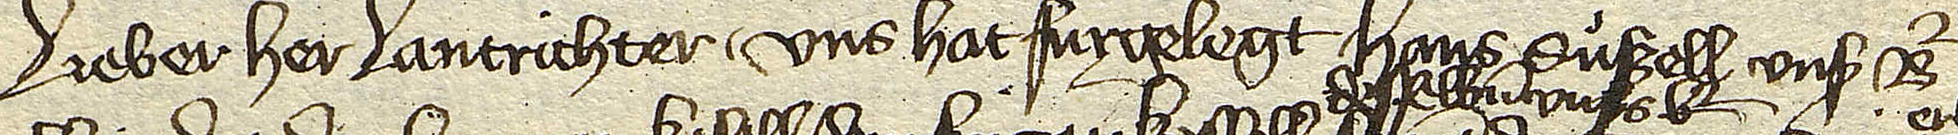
Lieber her Lantrichter / vns hat fürgelegt / hans Süſʒell vnſ* B*
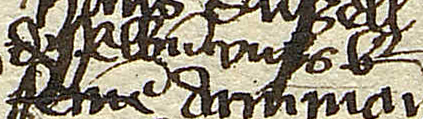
deſſelbn* vnſ*s b*
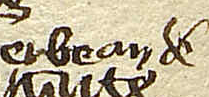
erbe an de*
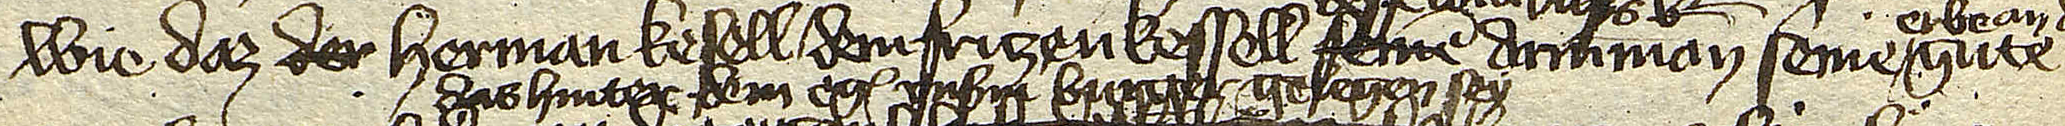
wie daʒ der herman keſell / dem fricʒen keſſell ſeine Armman* ſeine gute
